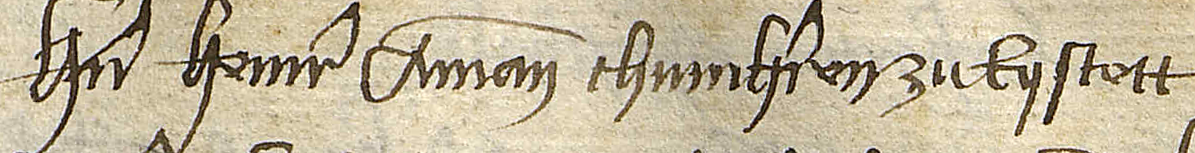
Hn* heinr* Am*an tumh*ren ʒu Eyſtett
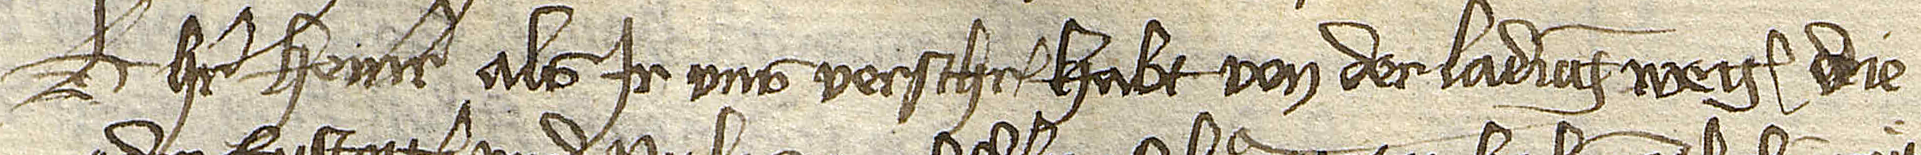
L* hr* heinr* als Ir vns verſchr* habt von der ladu*g weg* die
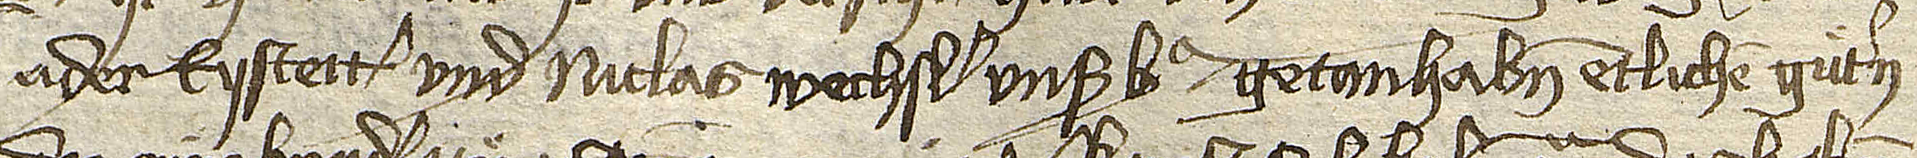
~ der Eyſtett* vnd Niclas wechſl* vnſ* b* / getan habn* etliche* güt*n
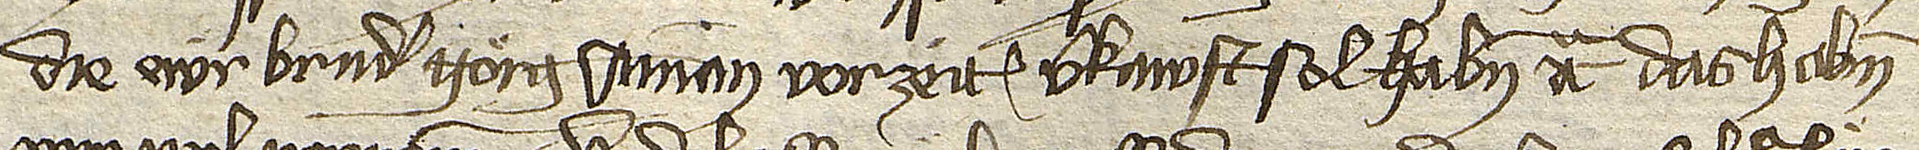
die eẅr brud* görg Am*an vorʒeit* v*kawft ſol habn* ec* das habn*
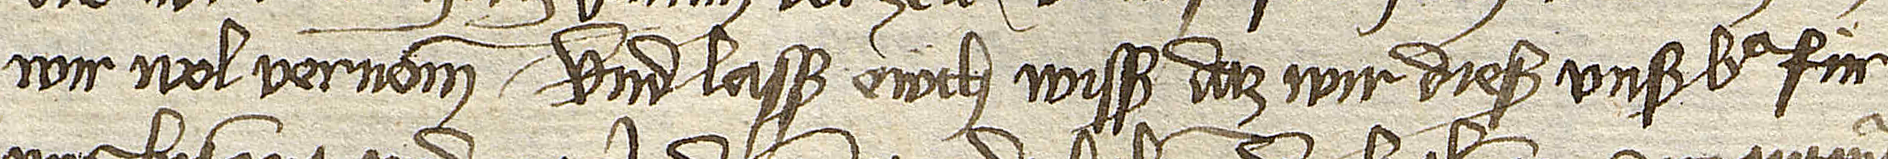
wir wol vernom* / Vnd laſſ* eẅch wiſſ* daʒ wir dieſ* vnſ* b* für
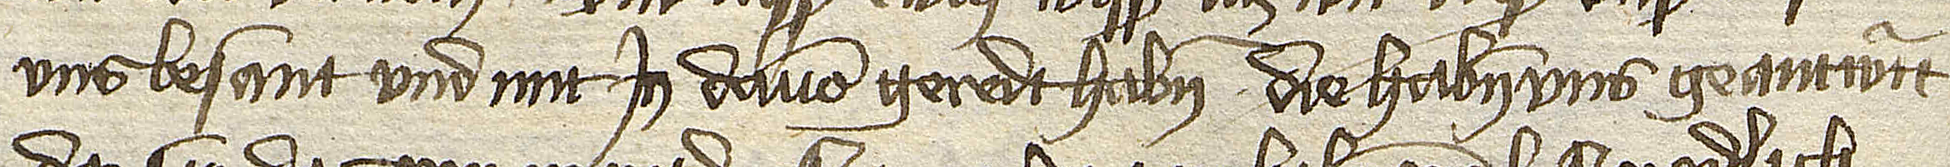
vns beſant vnd mit In dauo* geredt habn* . die habn* vns geantw*tt
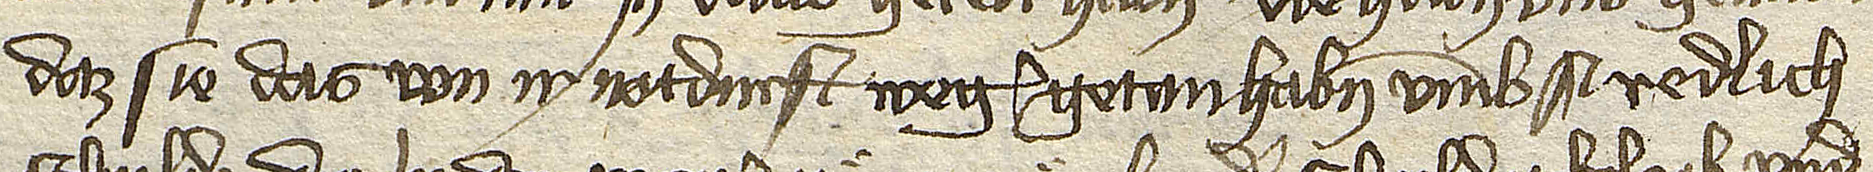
daʒ ſie das von ir notdurft weg* getan habn* vmb ſi redlich
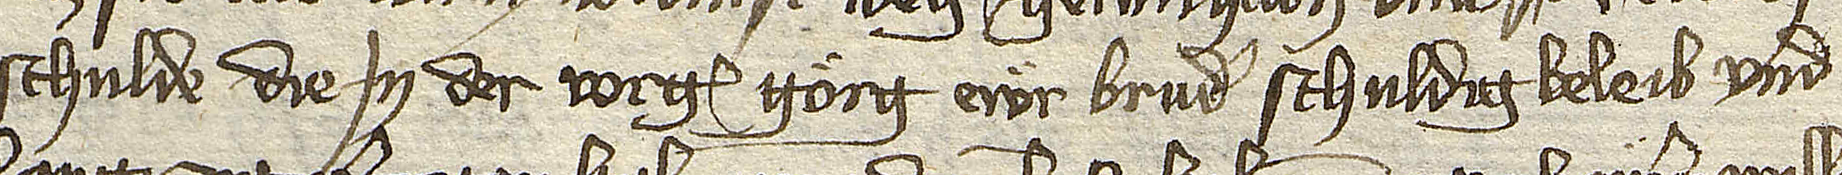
ſchulde / die In der vorg* görg eẅr brud* ſchuldig beleib vnd
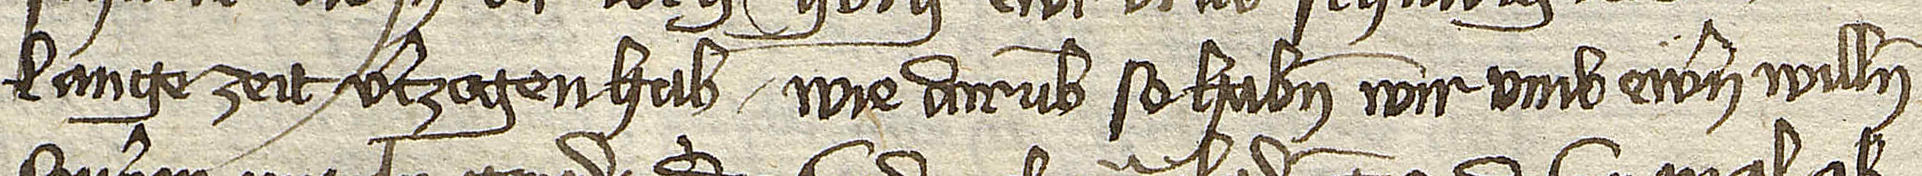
lange ʒeit v*cʒogen hab / wie darub* ſo habn* wir vmb eẅ*n willn*
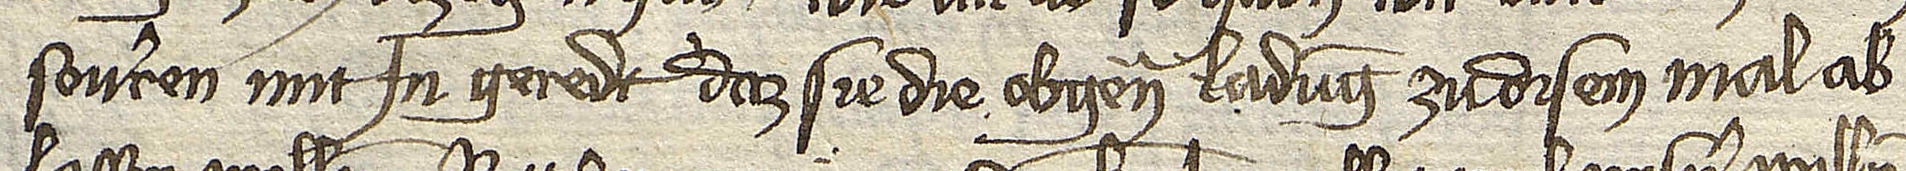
ſou*ren mit In geredt daʒ ſie die obgen* ladu*g ʒu diſem mal ab
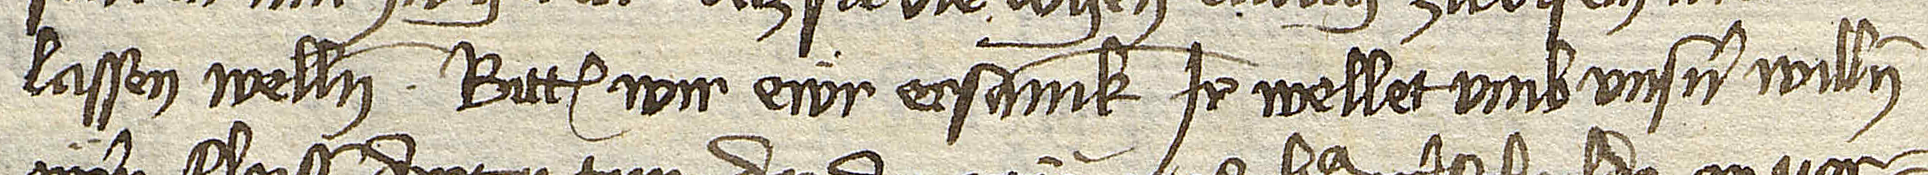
laſſen welln* . Bitt* wir eẅr erſamk* Ir wellet vmb vnſn* willn*
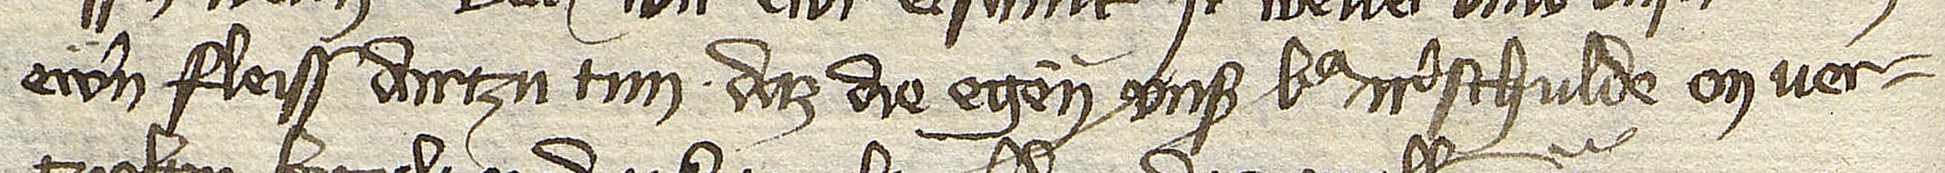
eẅ*n fleiſſ darcʒu tun . daʒ die egen* vnſ* b* ir* ſchulde on uer =
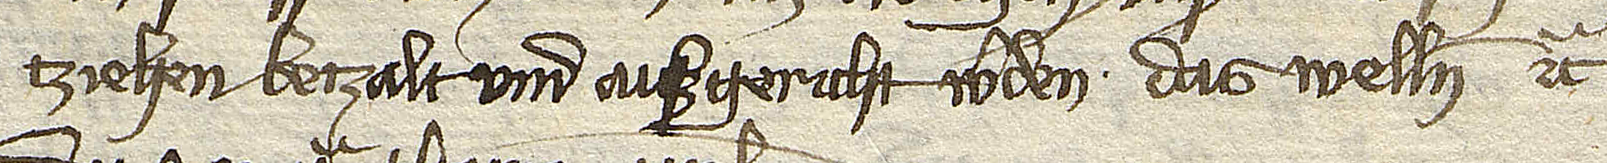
cʒiehen becʒalt vnd auſʒgericht w*den . das welln* ec*
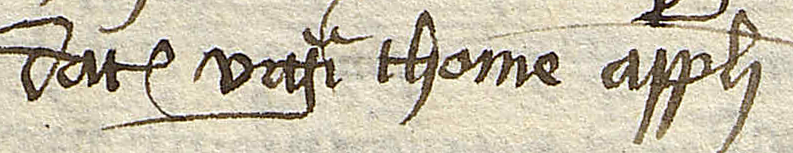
Dat* vigi* thome appli*
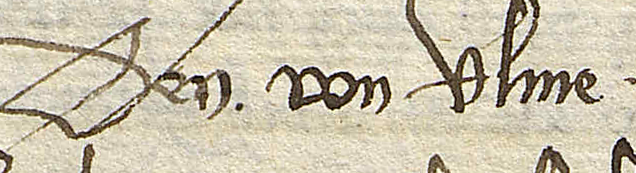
Den von Vlme
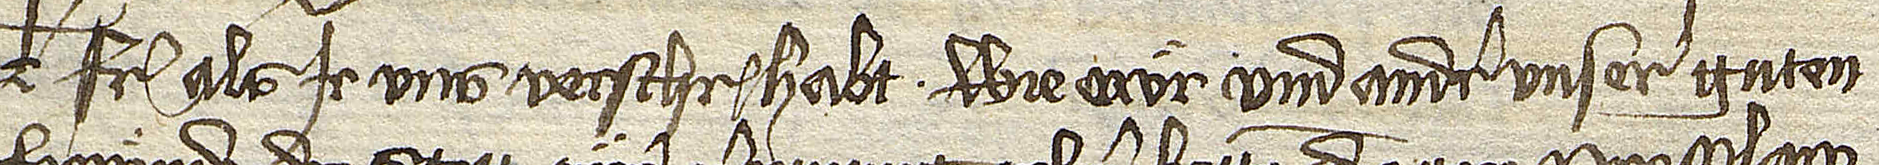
L* fr* als Ir vns verſchr* habt . wie eẅr vnd andr* vnſer* guten
